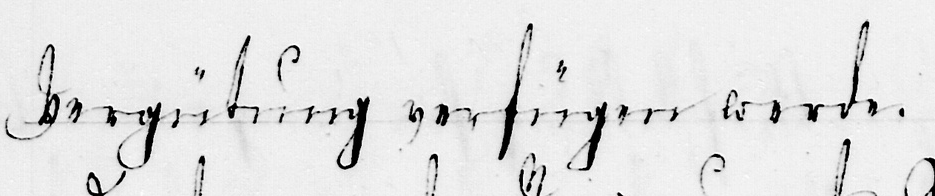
Vergütung verfügen werde.
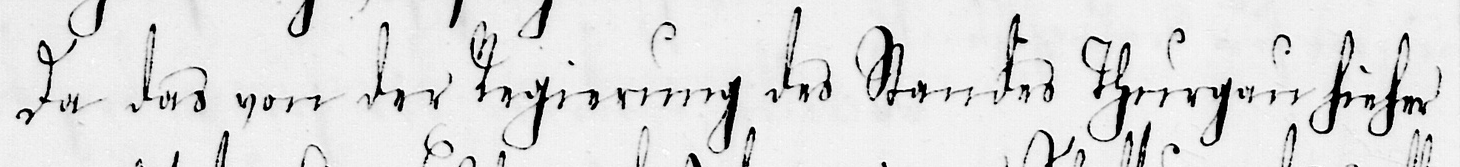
Da das von der Regierung des Standes Thurgau hieher
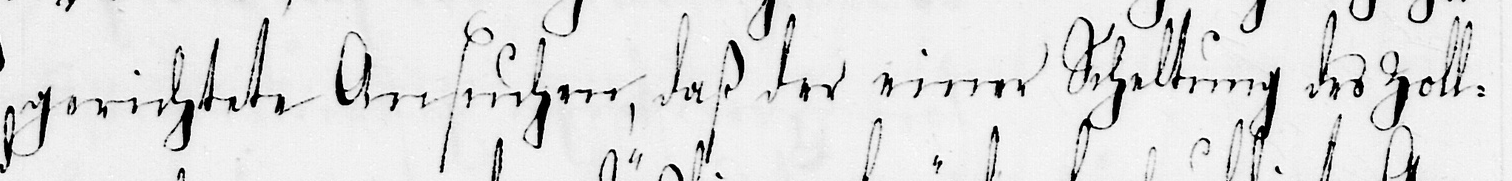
gerichtete Ansuchen, daß der einer Scheltung des Zoll¬
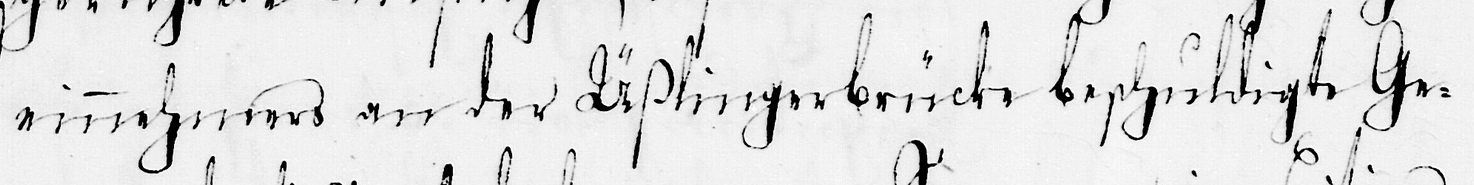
einnehmers an der Üßlingerbrücke beschuldigte Ge¬
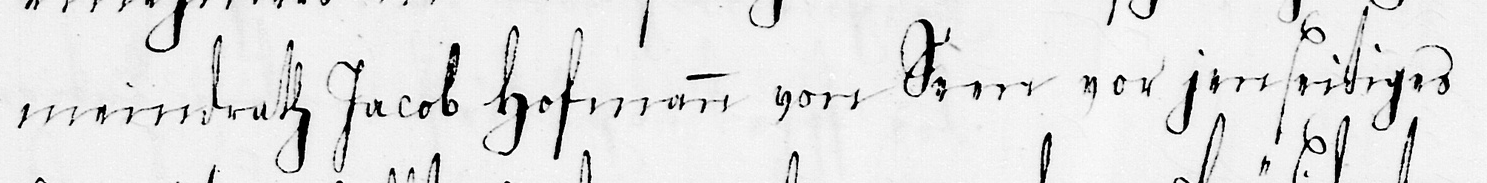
meindrath Jacob Hofmann von Seen vor jenseitiges
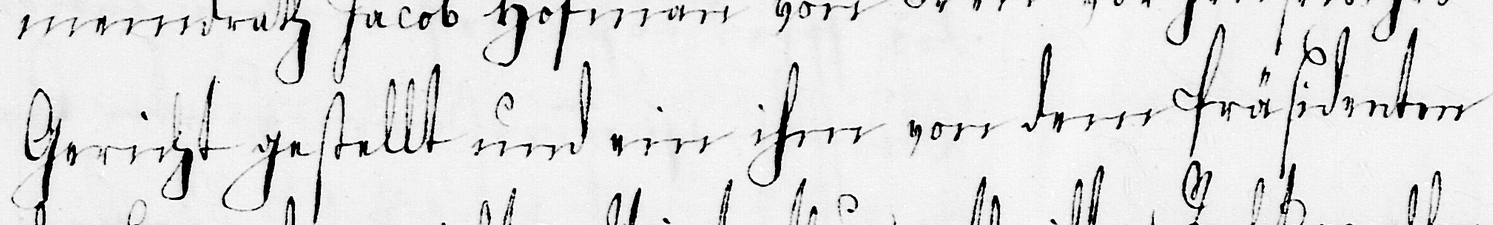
Gericht gestellt und ein ihm von dem Präsidenten
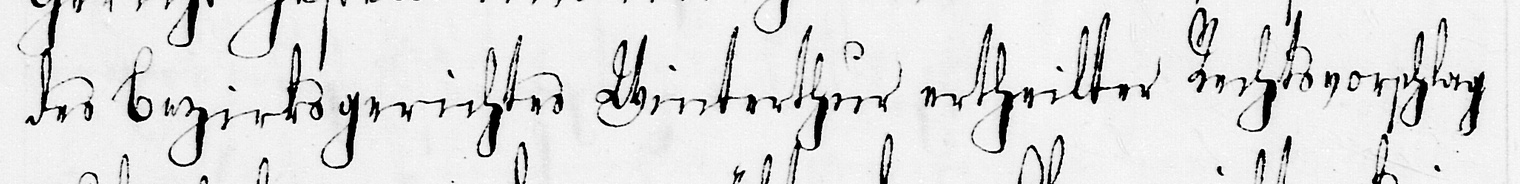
des Bezirksgerichtes Winterthur ertheilter Rechtsvorschlag
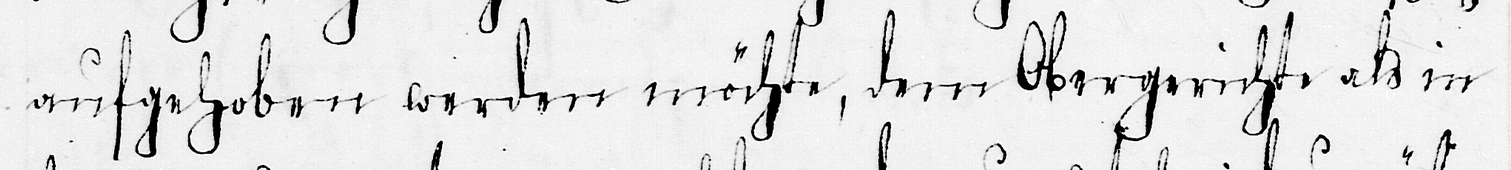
aufgehoben werden möchte, dem Obergerichte als in
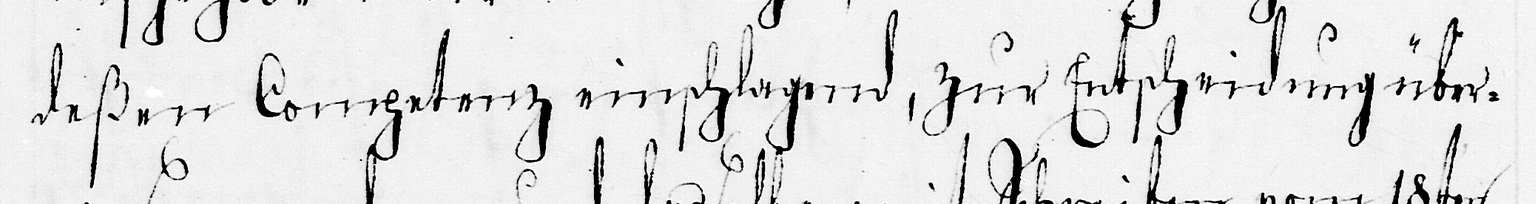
deßen Competenz einschlagend, zur Entscheidung über¬
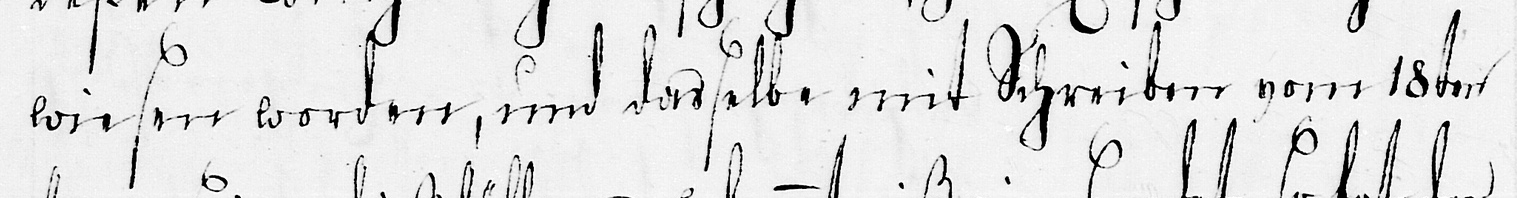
wiesen worden, und dasselbe mit Schreiben vom 18ten
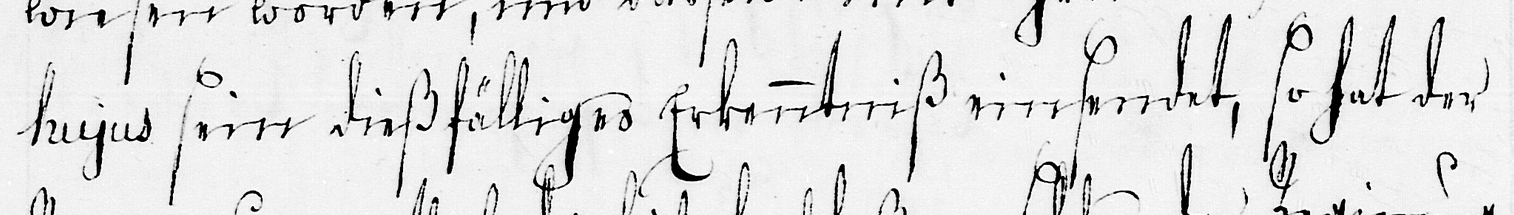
hujus sein dießfälliges Erkenntniß einsendet, so hat der
